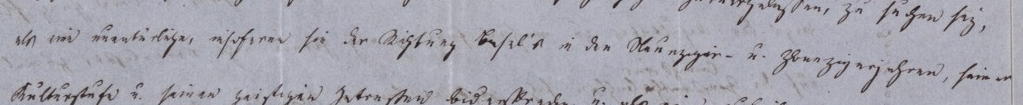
als eine unnatürliche, insoferne sie der Richtung Basel's in den Neunziger- u. Zwanzigerjahren, seiner
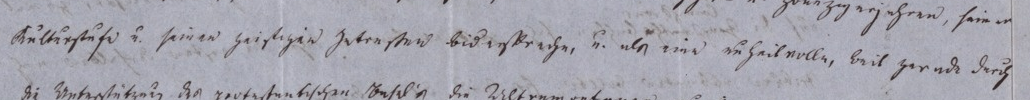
Kulturstufe u. seinen geistigen Intressen widerspreche, u. als eine unheilvolle, weil gerade durch
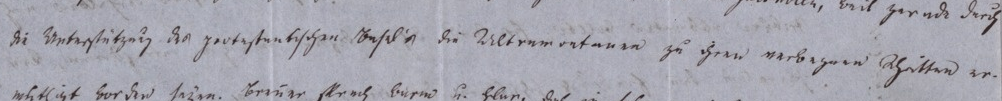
die Unterstützung des protestantischen Basel's die Ultramontanen zu ihren verwegnen Schritten er-
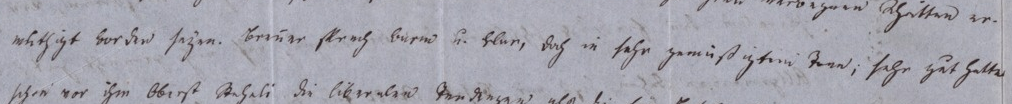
muthigt worden seyen. Brenner sprach warm u. klar, doch in sehr gemäßigtem Tone; sehr gut hatte
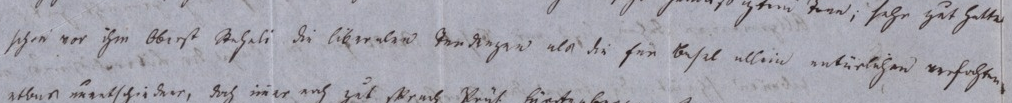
schon vor ihm Oberst Steheli die liberalen Tendenzen als die für Basel allein natürlichen verfochten,
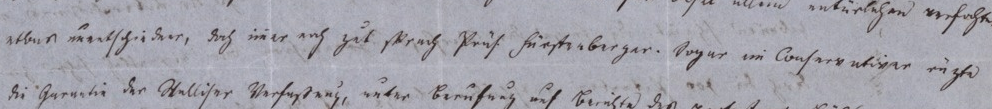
etwas unentschiedner, doch immer noch gut sprach Präs. Fürstenberger. Sogar ein Conservativer rügte
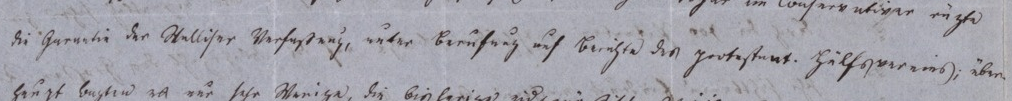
die Garantie der Walliser Verfassung, unter Berufung auf Berichte des protestant. Hülfsvereins; über-
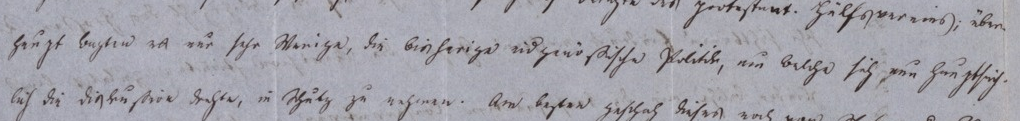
haupt wagten es nur sehr Wenige, die bisherige eidgenössische Politik, um welche sich nun hauptsäch-
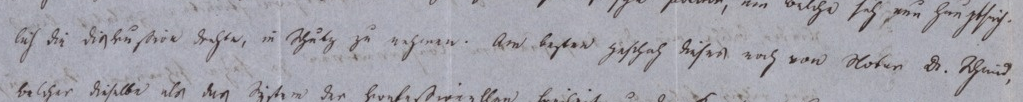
lich die Diskussion drehte, in Schutz zu nehmen. Am besten geschah dieses noch von Notar Dr. Schmid,
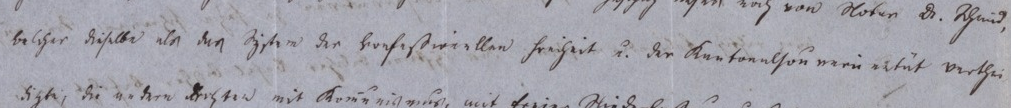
welcher dieselbe als das System der konfessionellen Freiheit u. der Kantonalsouveränität verthei-
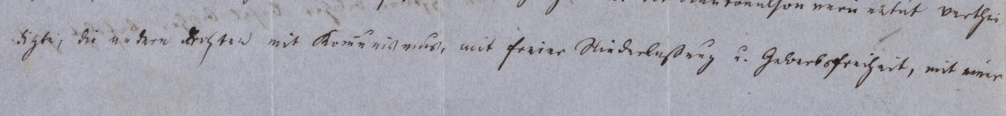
digte, die andern drohten mit Kommunismus, mit freier Niederlassung u. Gewerbsfreiheit, mit einer
